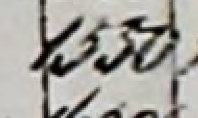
1550
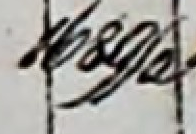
1689/a
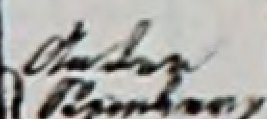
An der
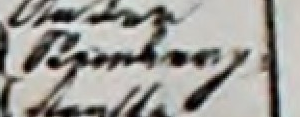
Steinberg„
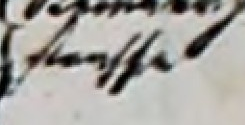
strasse
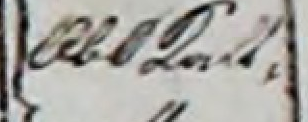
Als Katt„
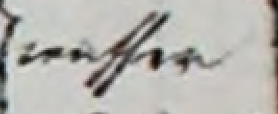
wasser
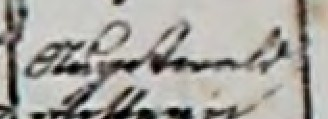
Augstwald
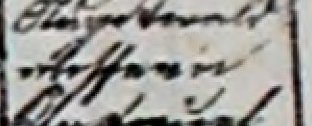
???
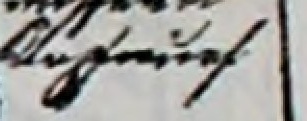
Kopf???
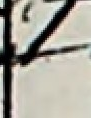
I
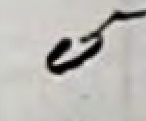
5
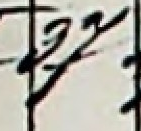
37
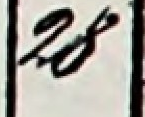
28
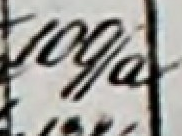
109/a
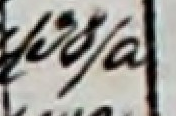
138/a
